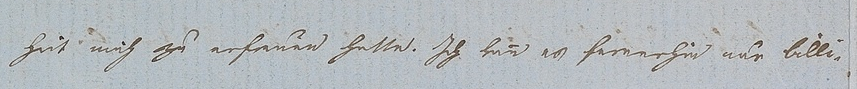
heit mich zu erfreuen hatte. Ich kann es fernerhin nur billi-
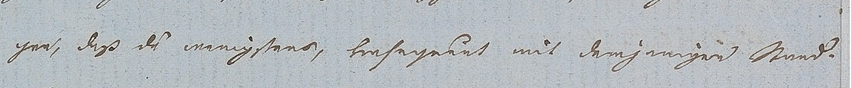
gen, daß Du wenigstens, konsequent mit demjenigen Stand-
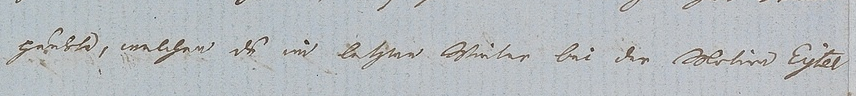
punkte, welchen Du im letzten Winter bei der Motion Eytel
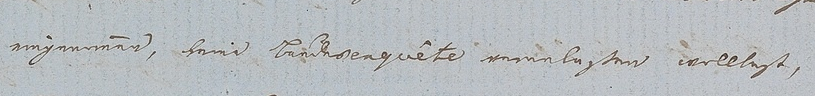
eingenommen, keine Bundesenquête veranlaßen wolltest,
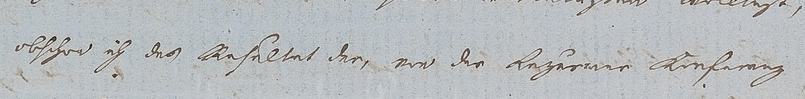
obschon ich das Resultat der, von der Luzerner Konferenz
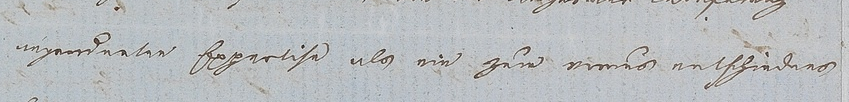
angeordneten Expertise als ein zum voraus entschiednes
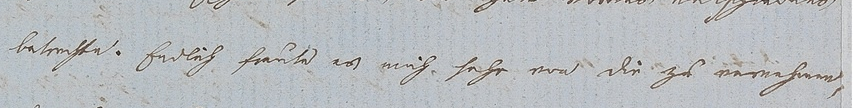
betrachte. Endlich freute es mich sehr von Dir zu vernehmen,
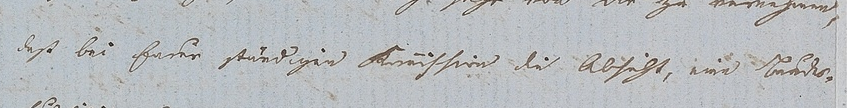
daß bei Eurer ständigen Kommission die Absicht, eine Bundes-
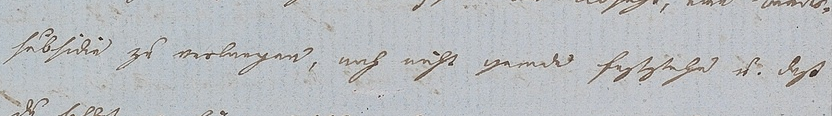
subsidie zu verlangen, noch nicht gerade feststehe u. daß
